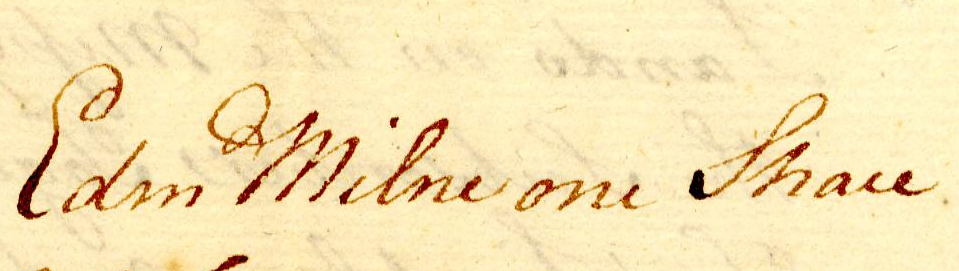Edw^d Milne one Share
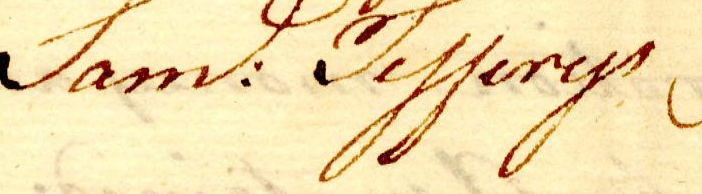Jam^s. Jefferys
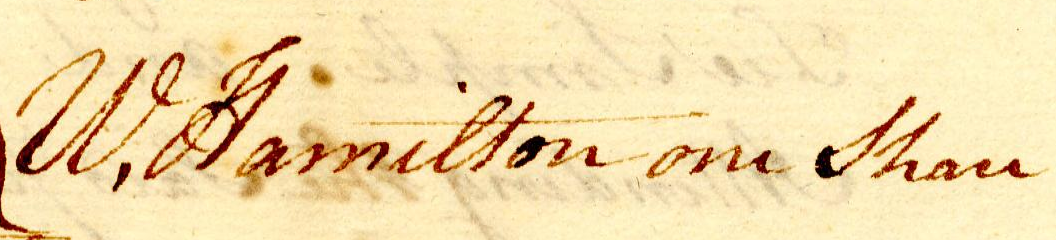W^m. Hamilton one Share
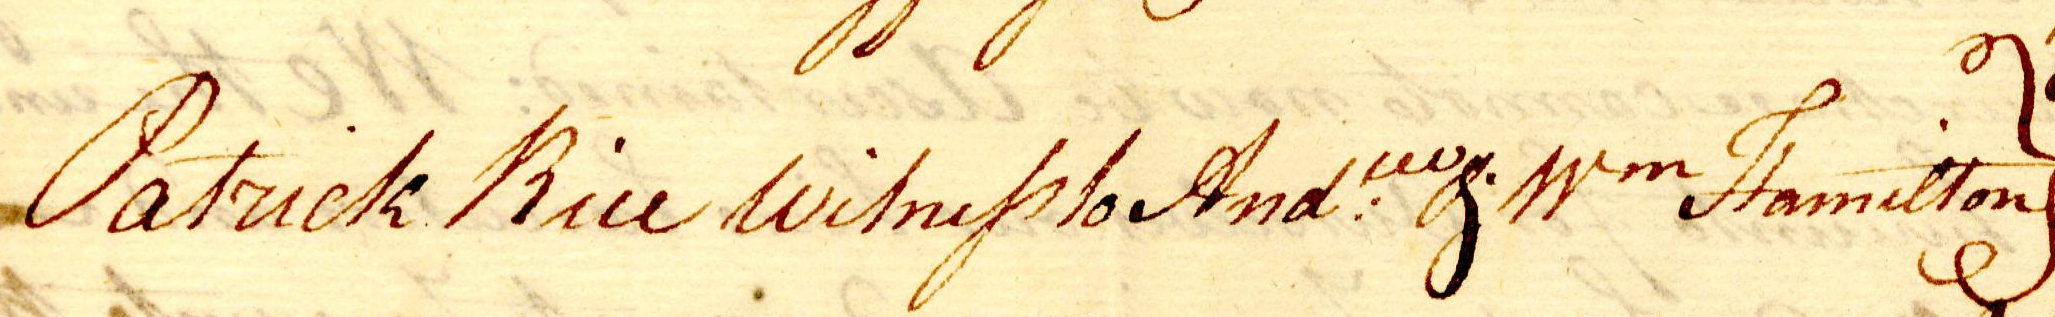Patrick Rice Witness to And^rew. & W^m. Hamilton
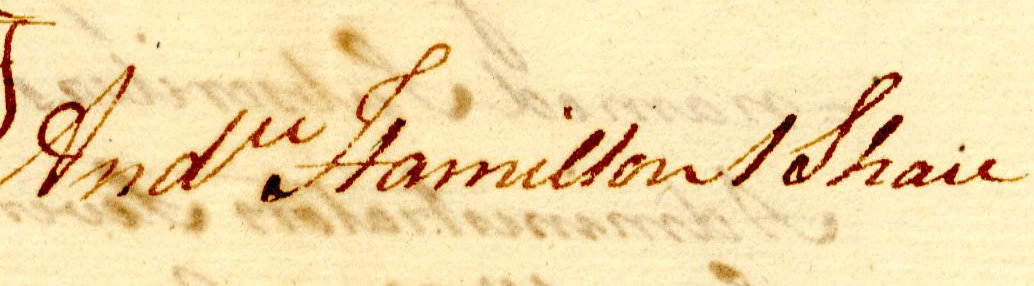And^w Hamilton 1 share
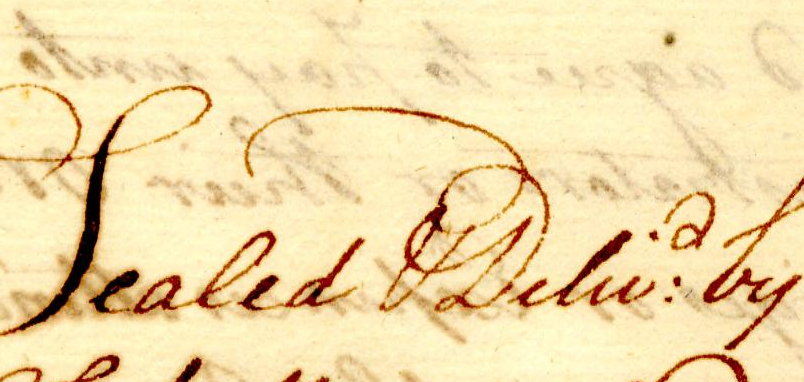Sealed & Deliv^d. by
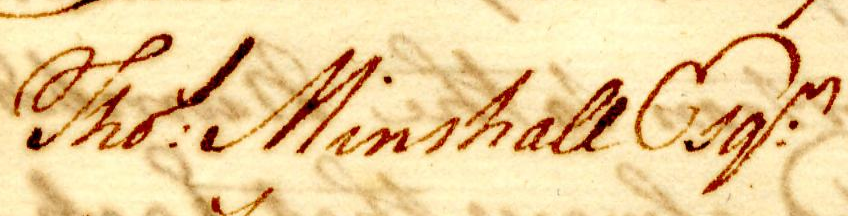Tho^s. Minshall Esq^r.
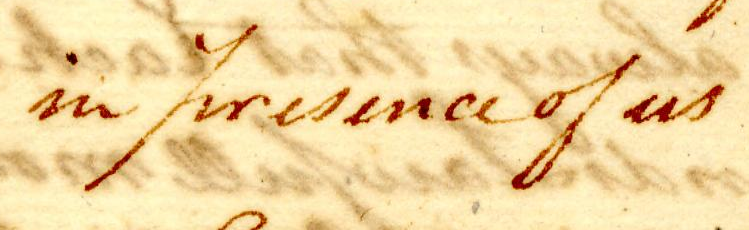in presence of us
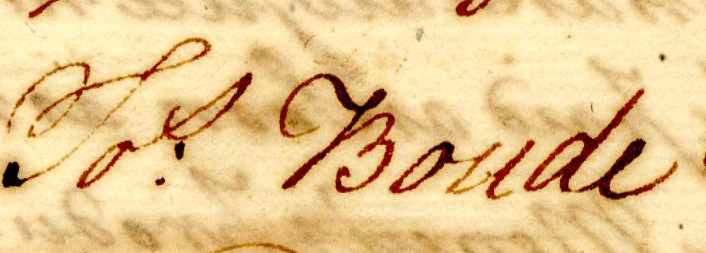Jo^s: Boude
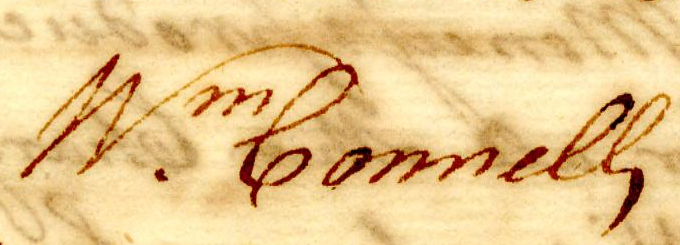W^m. Connelly
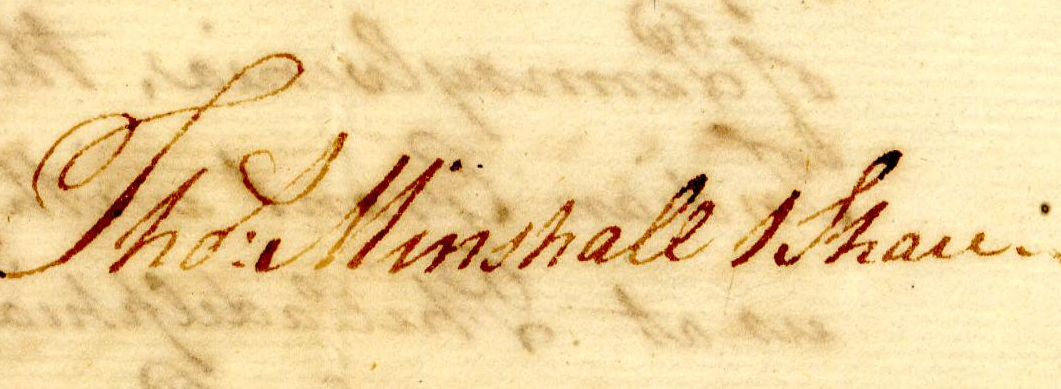Tho^s Minshall 1 share
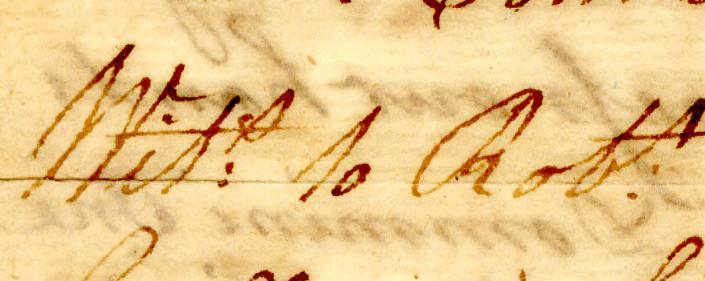Wit^s. to Rob^t.
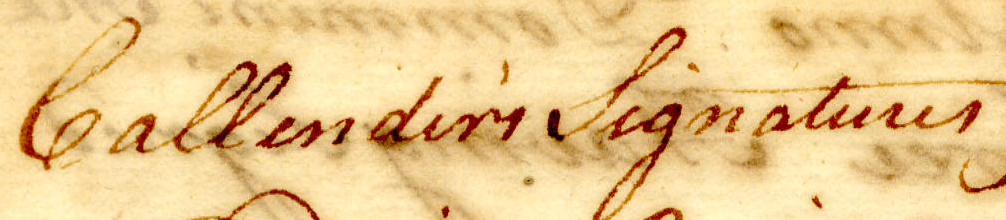Callenders Signatures
